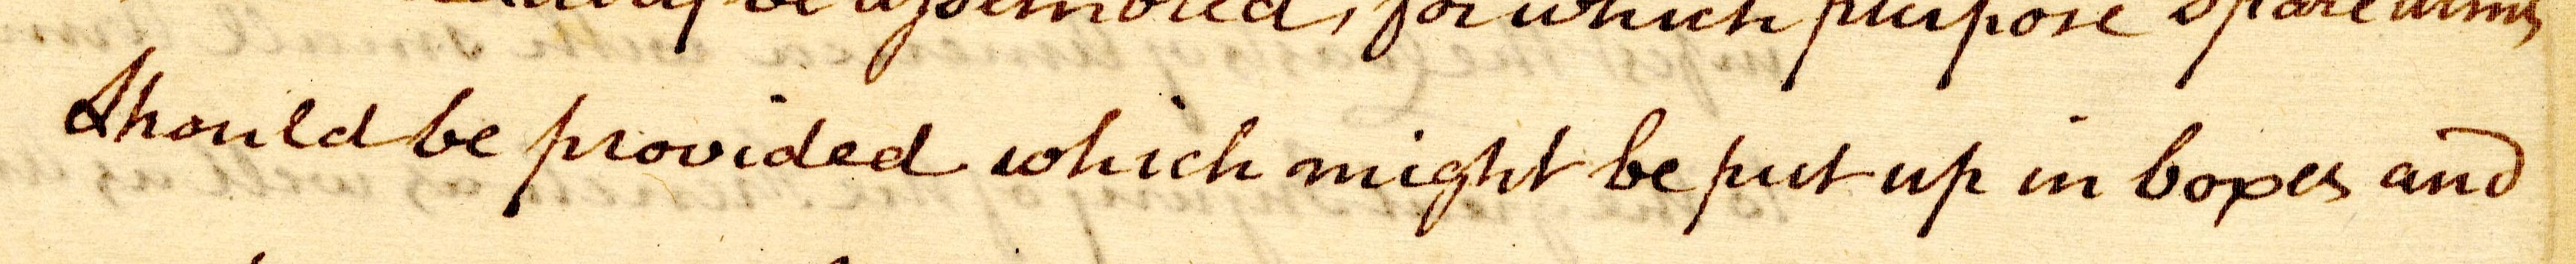should be provided which might be put up in boxes and
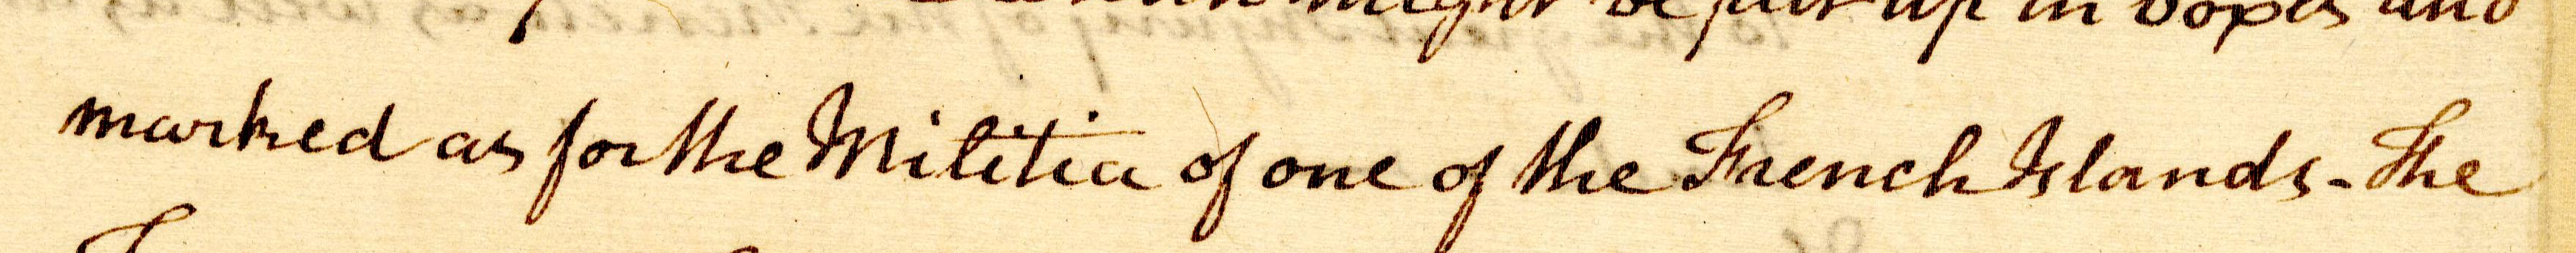marked as for the Militia of one of the French Islands- The
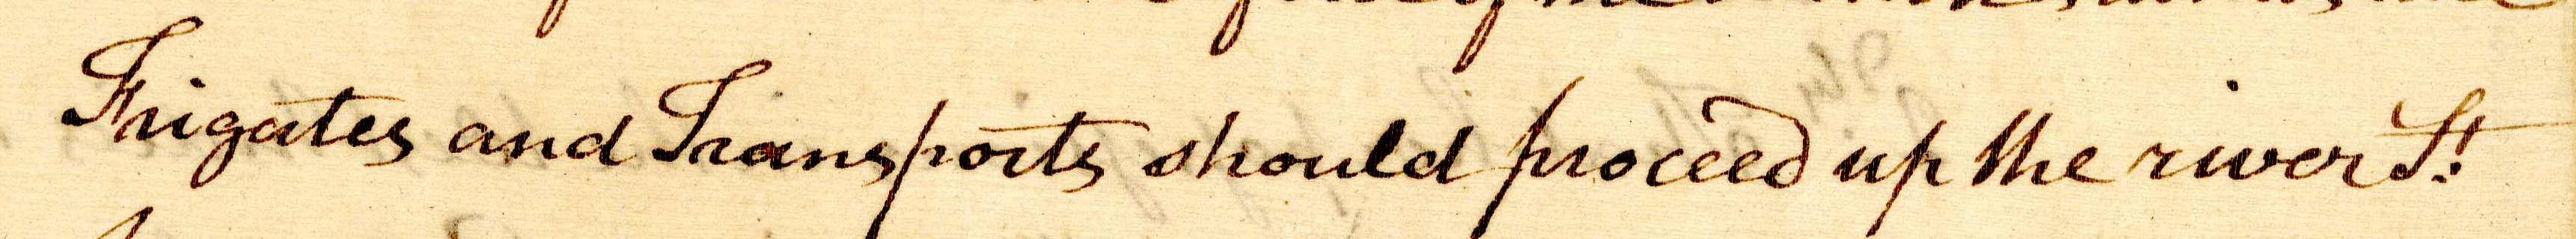Frigates and Transports should proceed up the rever S^t:
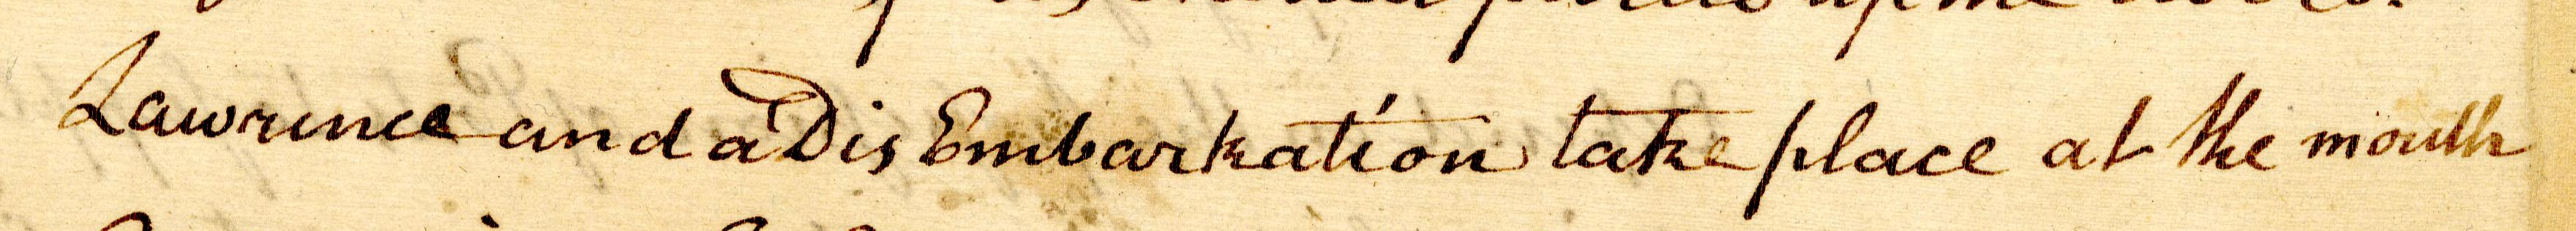Lawrence and a Dis Embarkation take place at the mouth
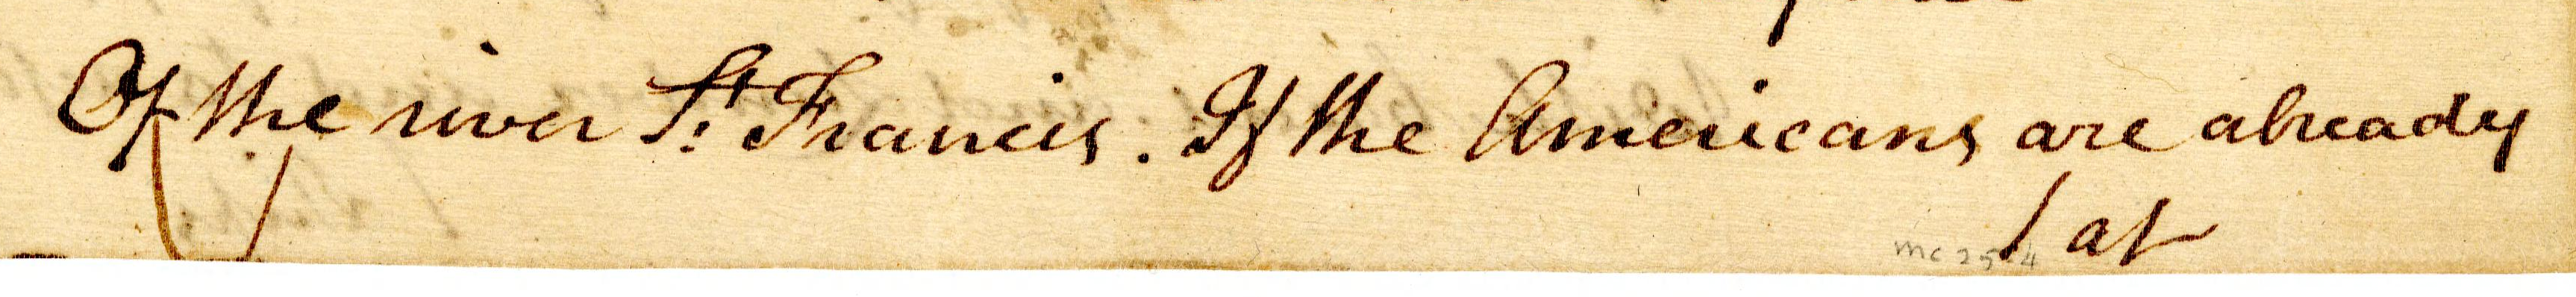Of the river S^t: Francis. If the Americans are already
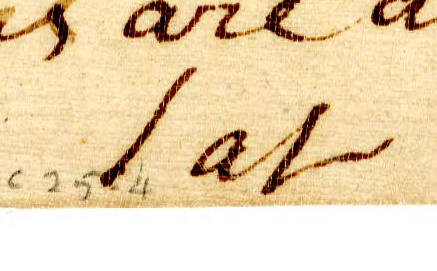at
